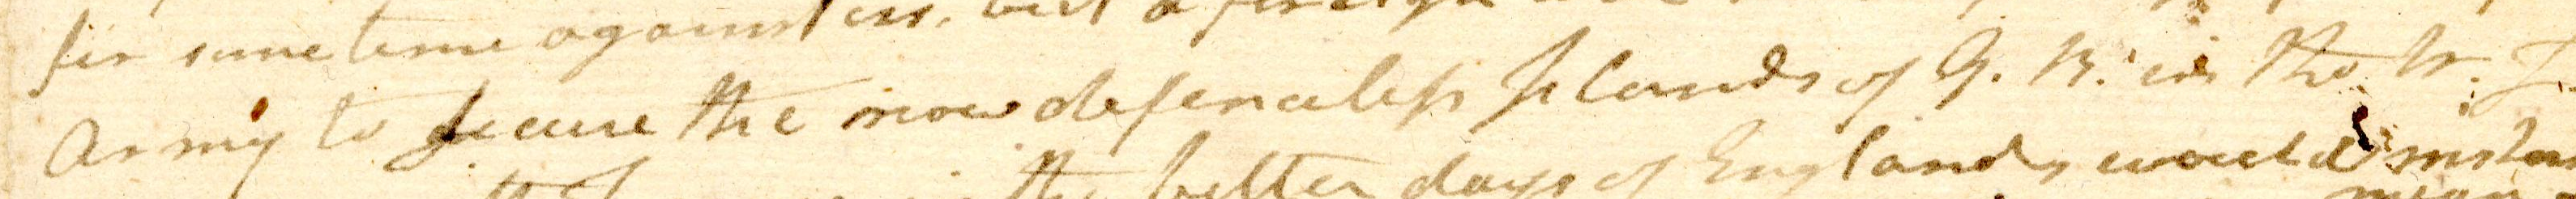Army to secure the now defenseless Islands of G. B. in the W.I.
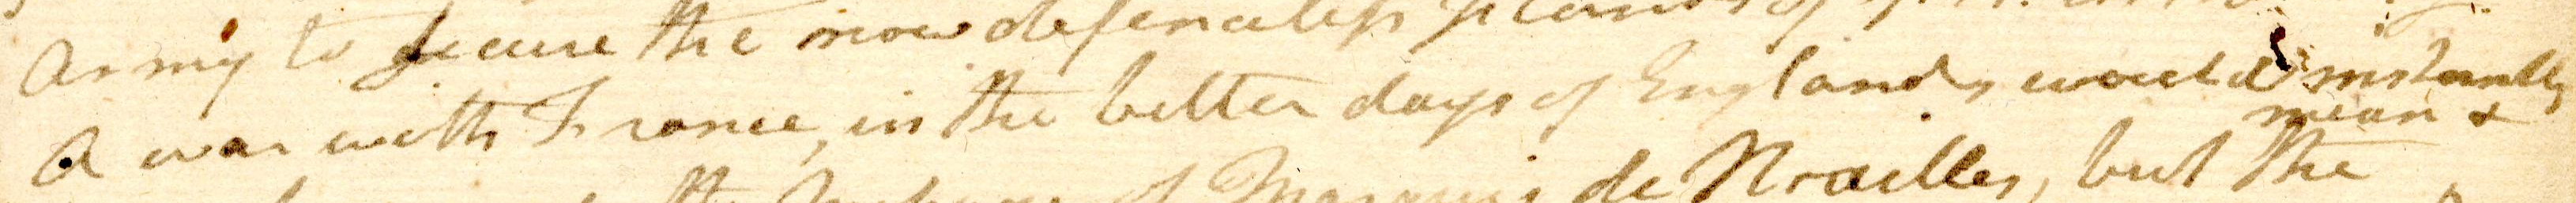a was with France, in the better days of England would instantly
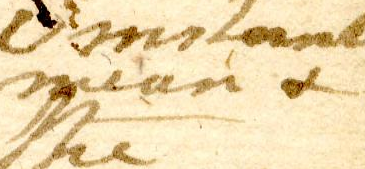mean &
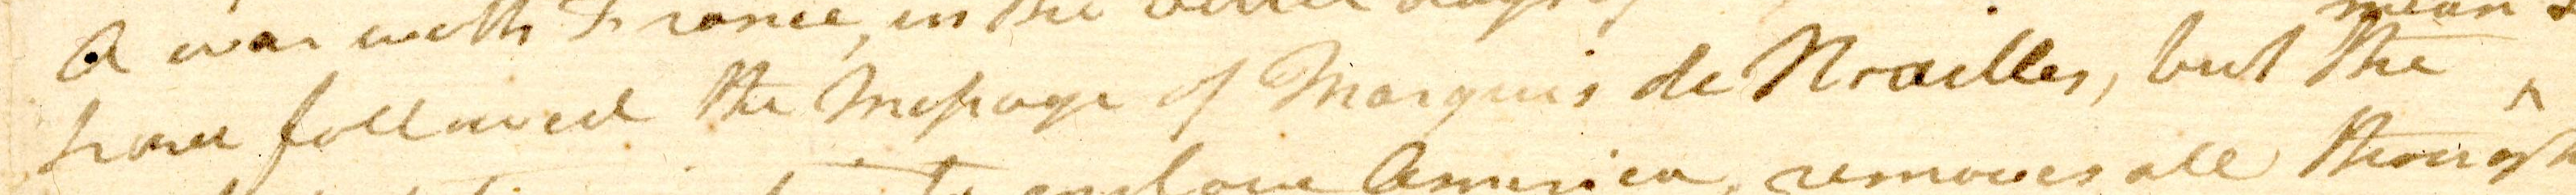have followed the message of Marquis de Noailles, but the ^
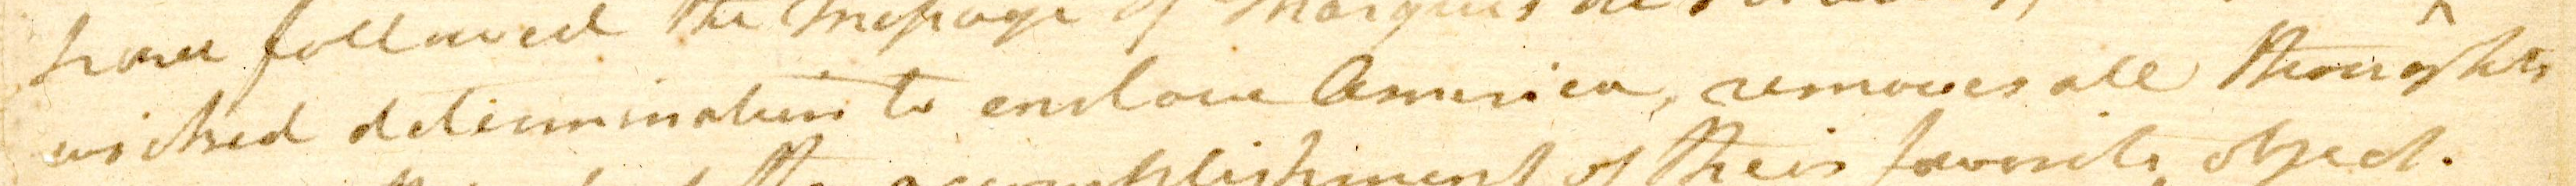wicked determination to enslave America, removes all thoughts
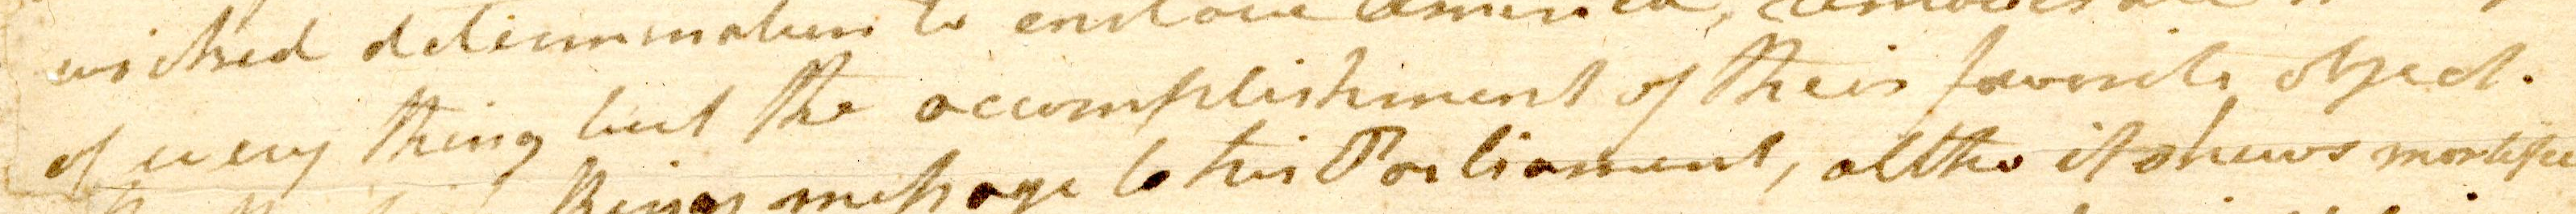of every thing but the accomplishment of their favorite object.
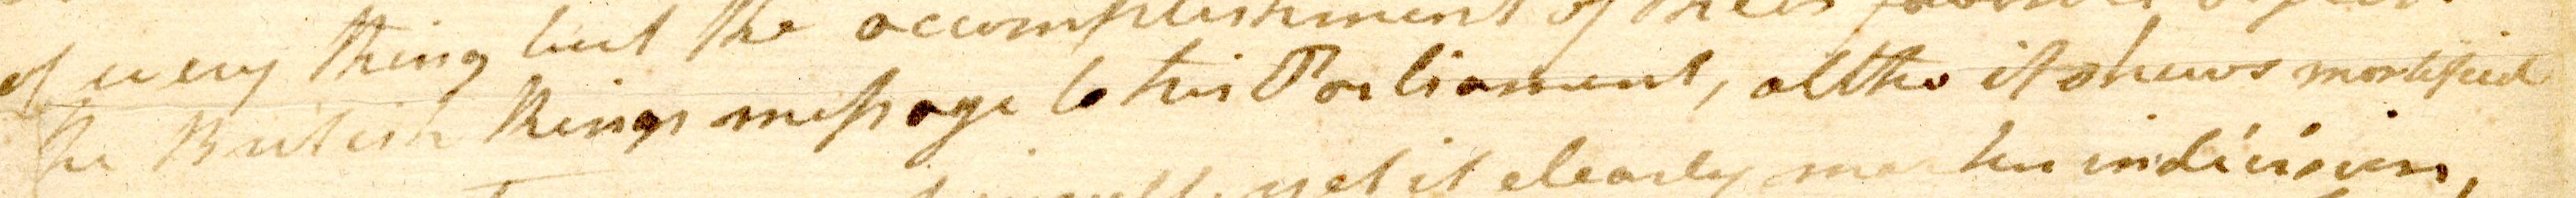The British Kings message to his Parliament, altho it shews mortified
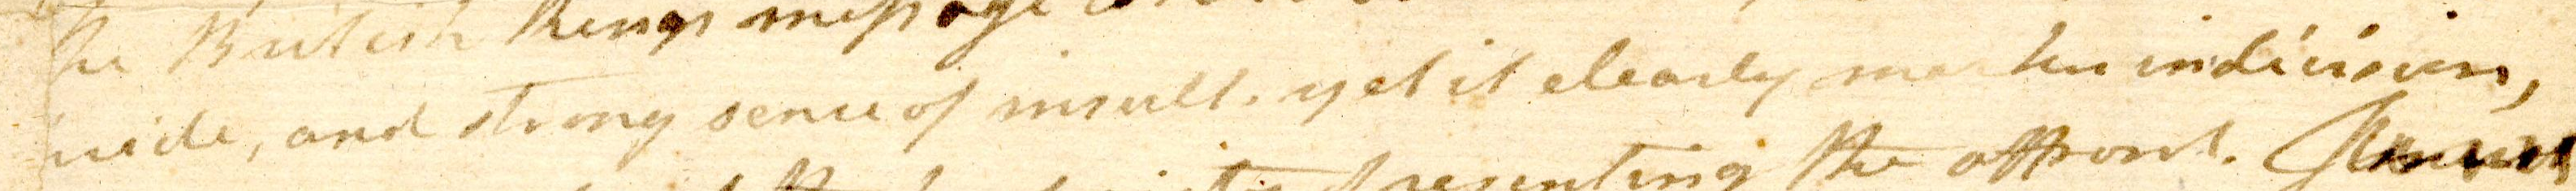pride, and strong sense of insult yet it clearly must be indicision,
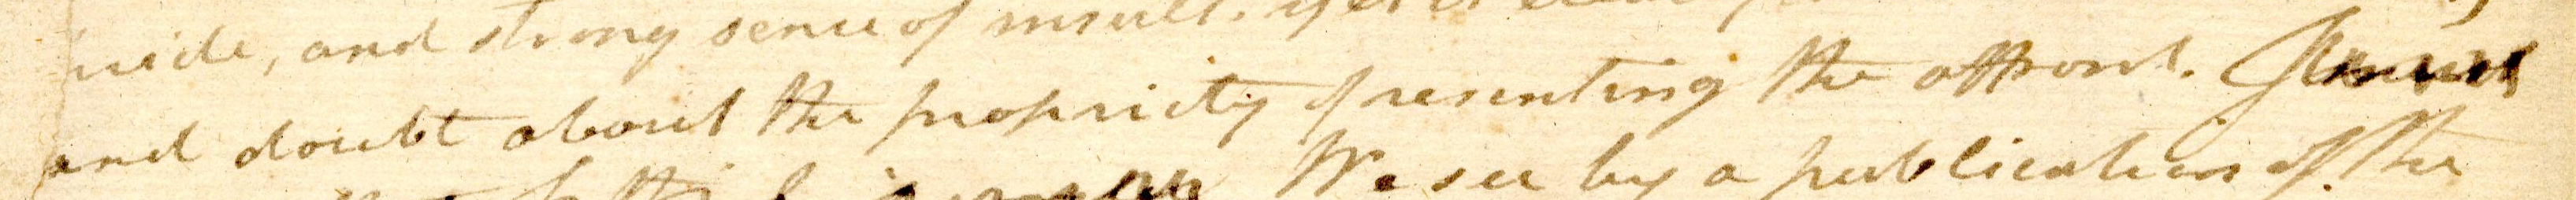and doubt about the propriety of resenting the affront. [_____]
